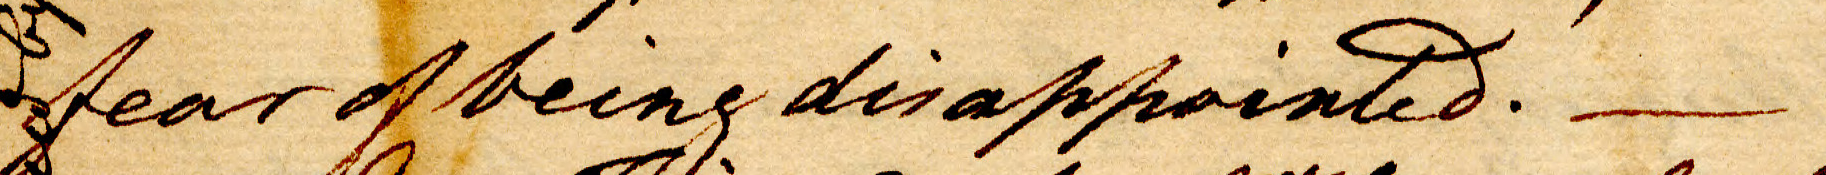fear of being disappointed.-
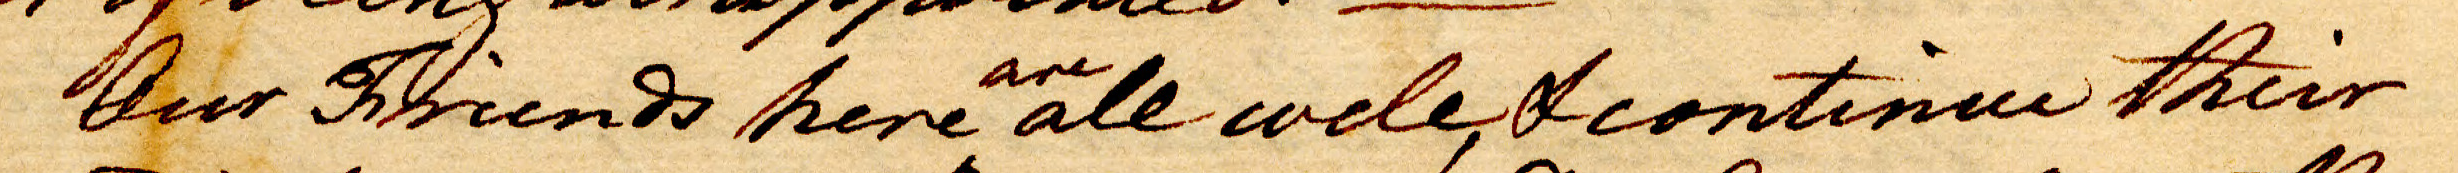Our friends here ^are all well, & continue their
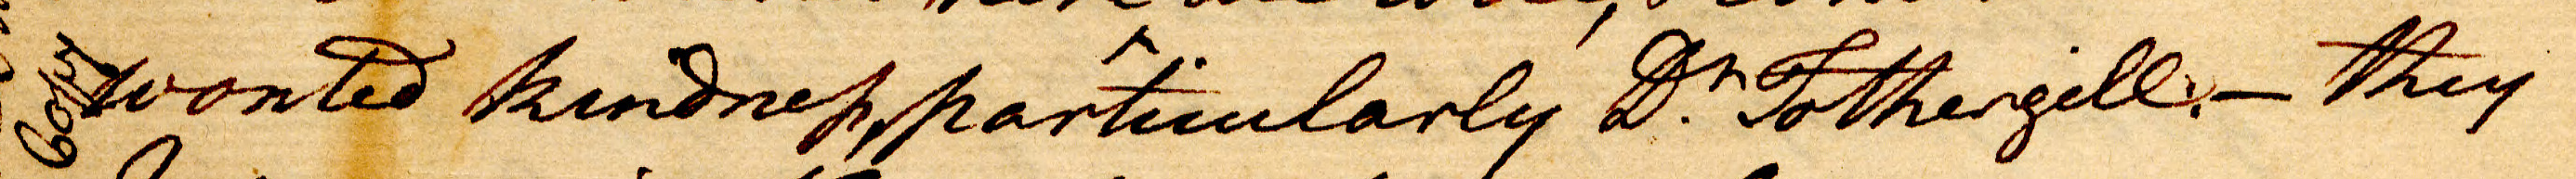wonted kindness, particularly D^r. Fothergill:- they
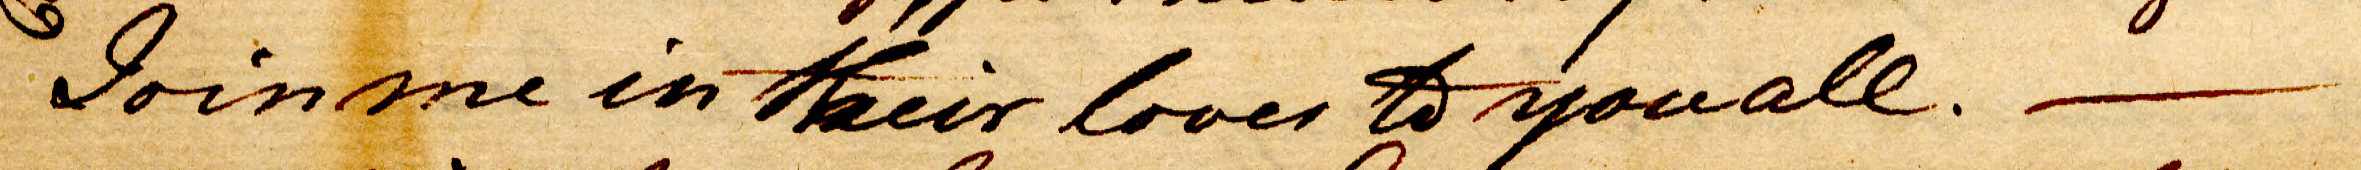Join me in their love to you all.-
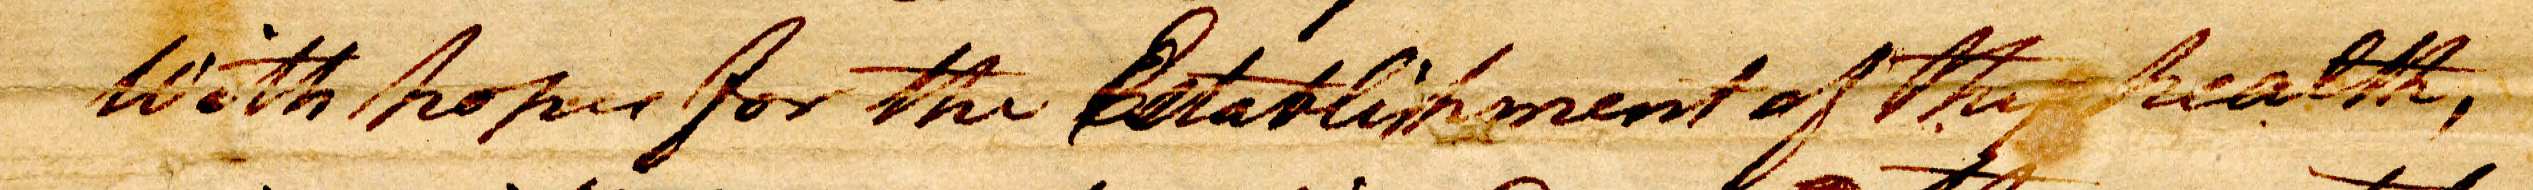With hopes for the Establishment of thy health,
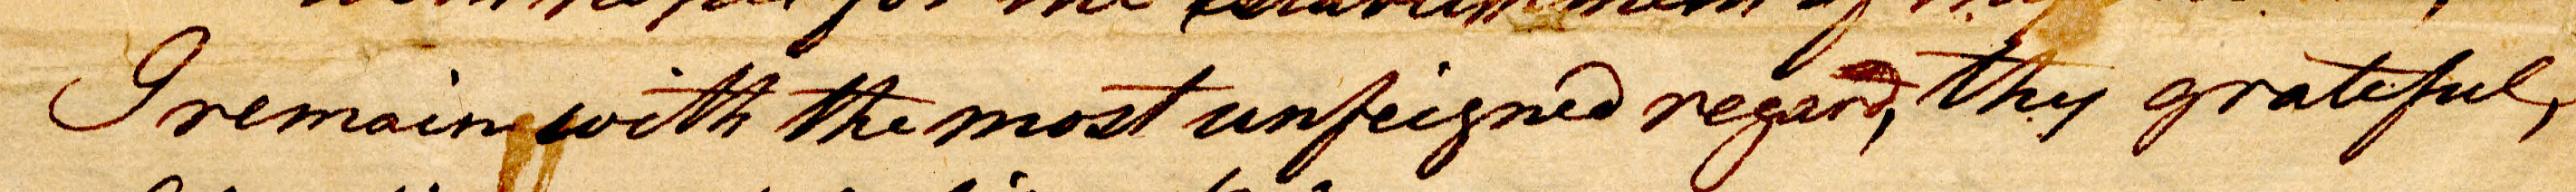I remain with the most unfeigned regard, thy grateful,
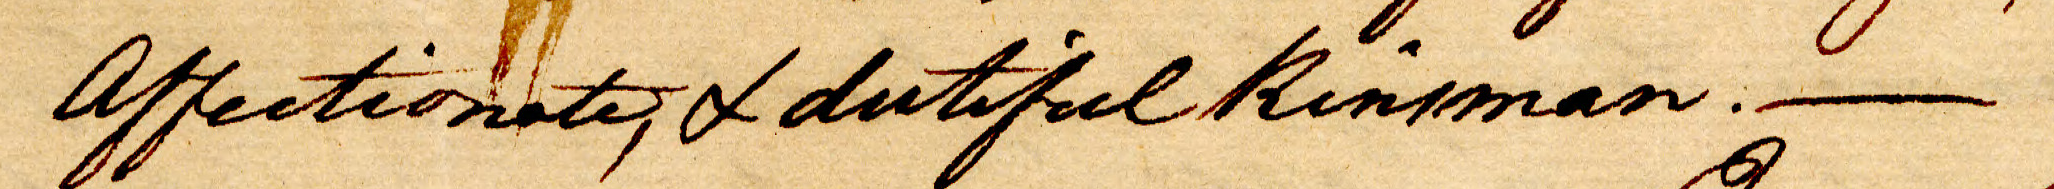Affectionate, & dutiful Kinsman.-
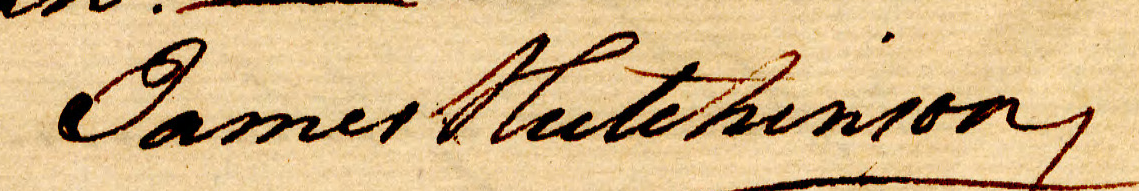James Hutchinson
